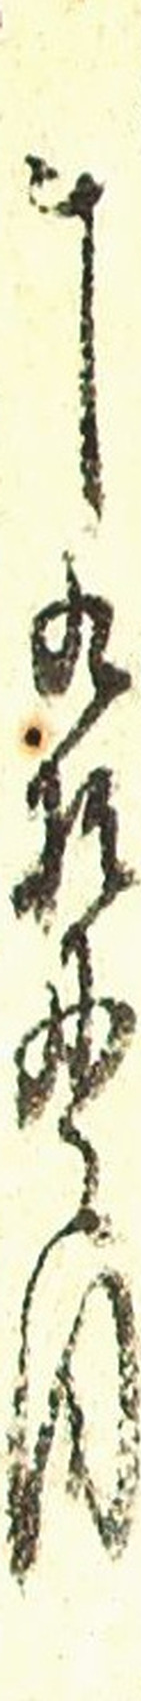正九拾貫目
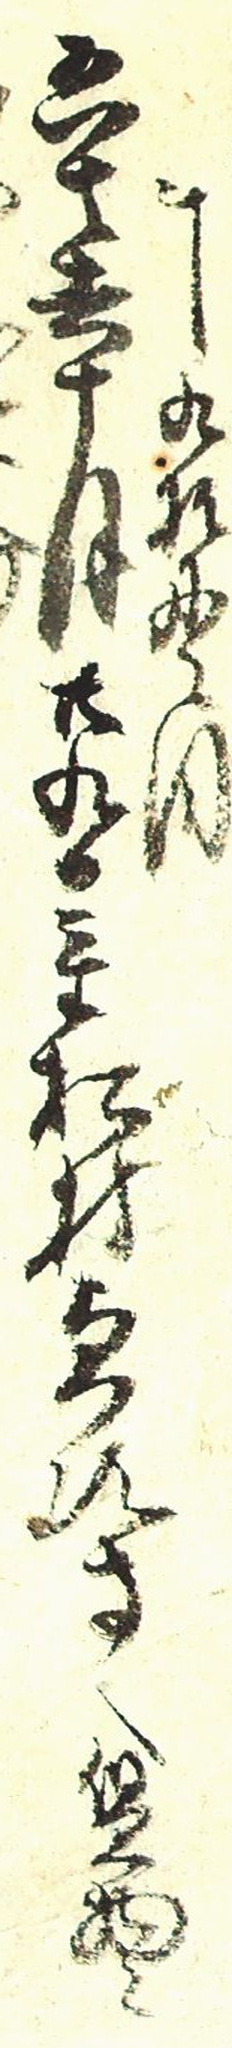右は去十月廿九日重松村貞次方へ質物に

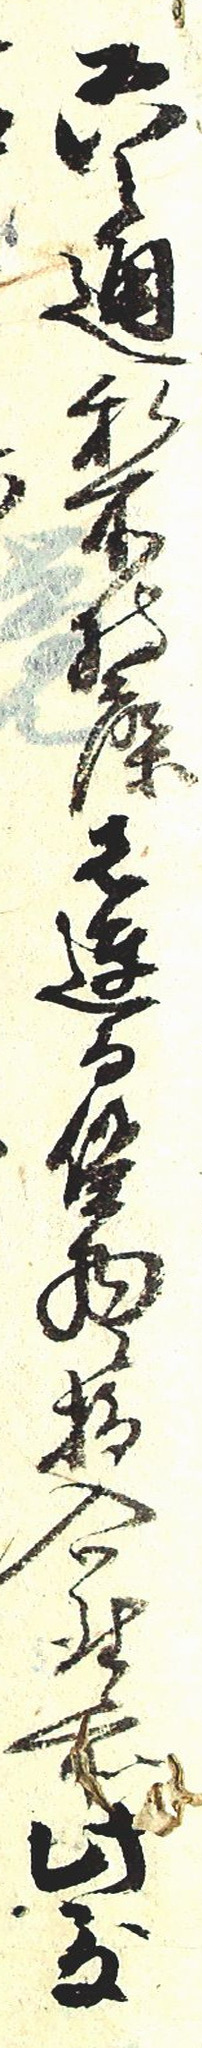右之通私所持蒅先達て質物に指入御座候所此度
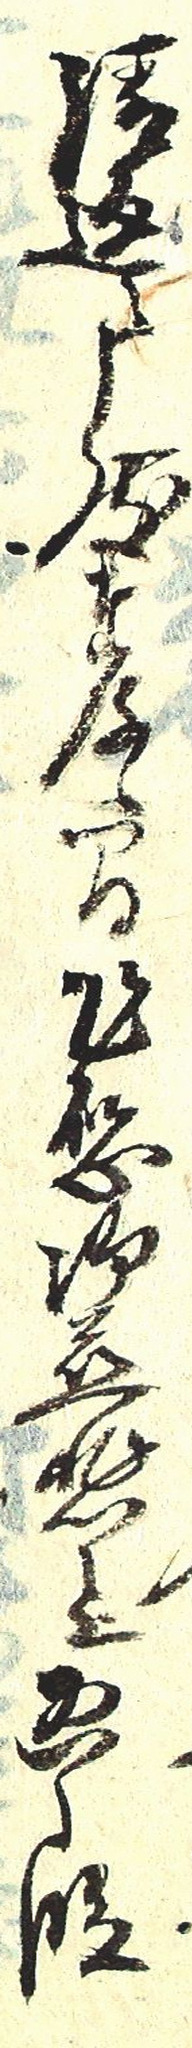請返し申度奉存候間乍恐御慈悲之上右之段
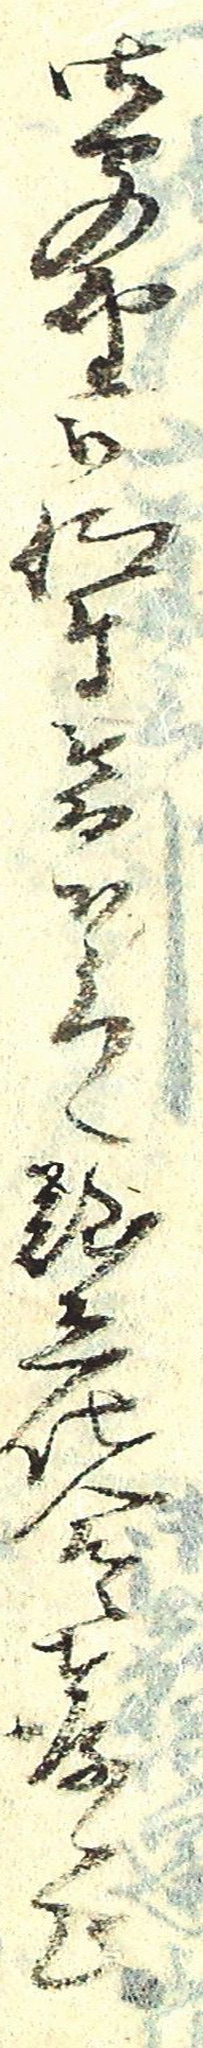御聞届被仰付被為下候はゝ難有仕合に奉存候以上
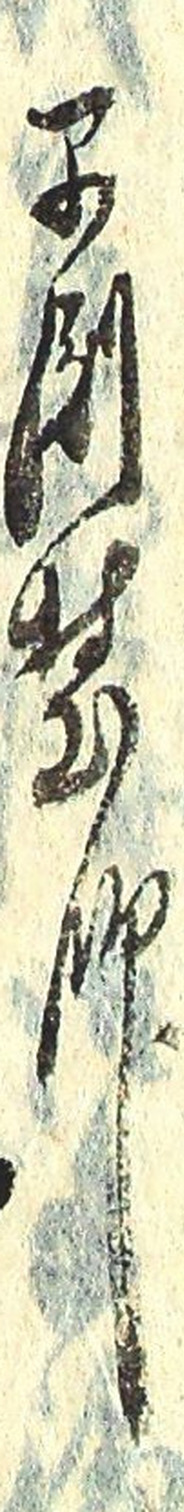早渕村玉師
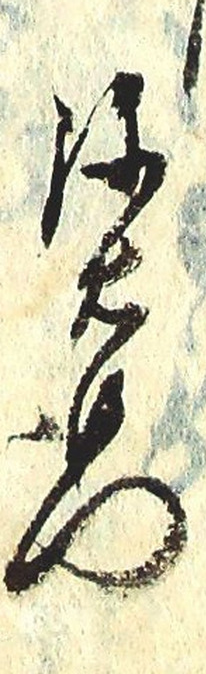弥右衛門
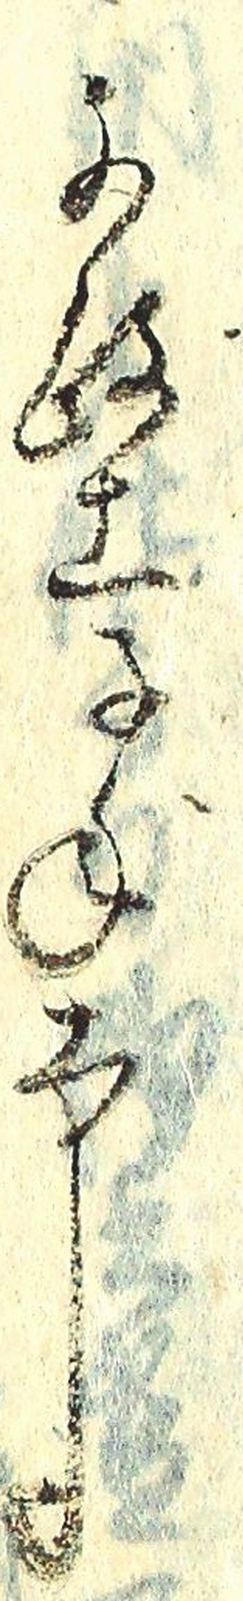文政十一子年十一月
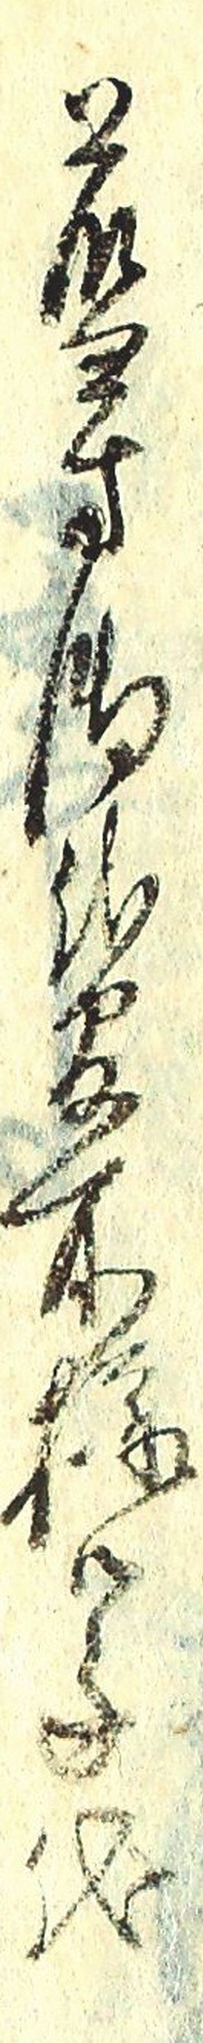藍方御代官所様御手代
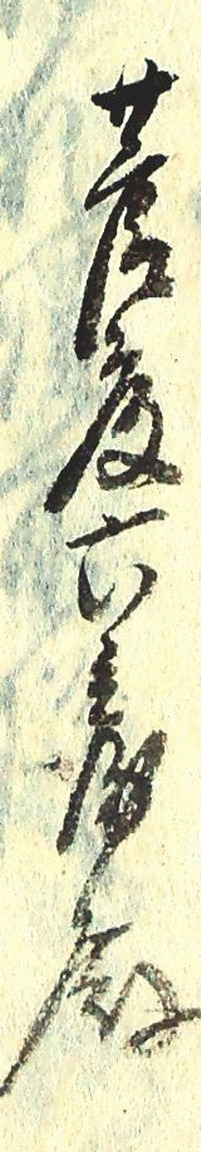菅藤六兵衛殿
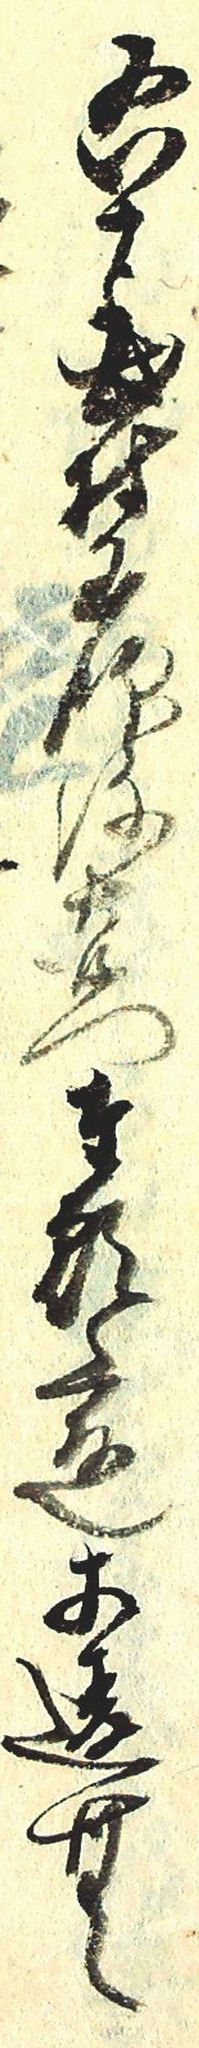右は当村玉師弥右衛門奉願上通相違無
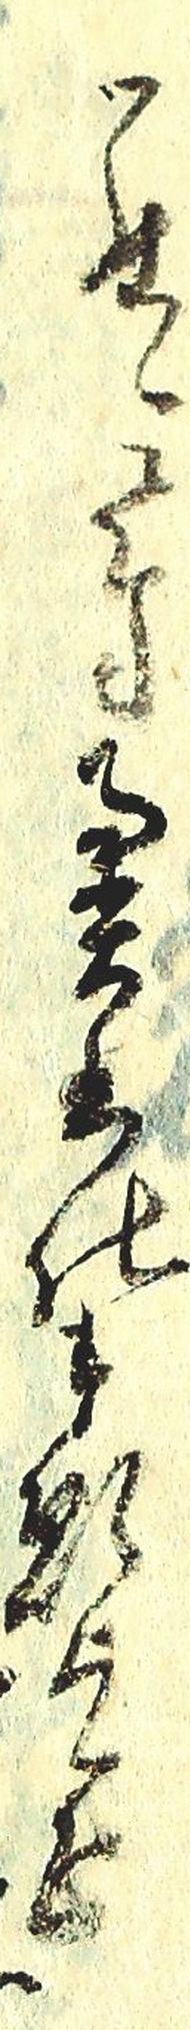御座候に付奥書仕奉願上候以上
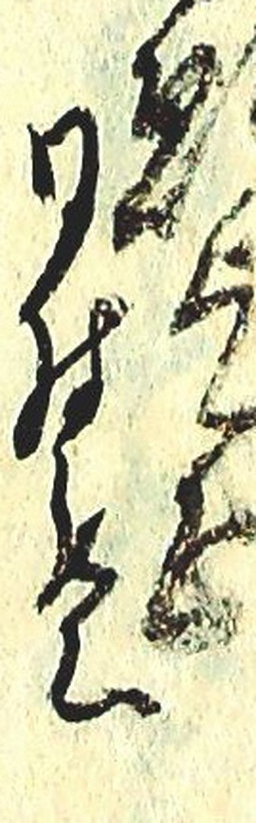同村庄屋
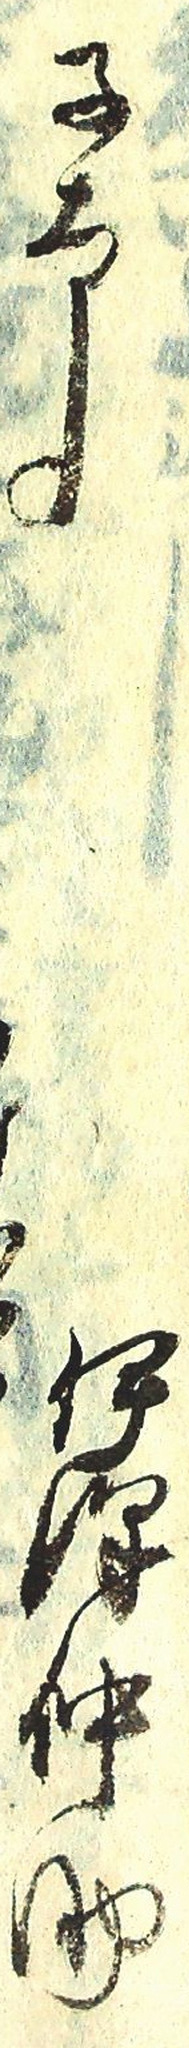子十一月伊沢仲助
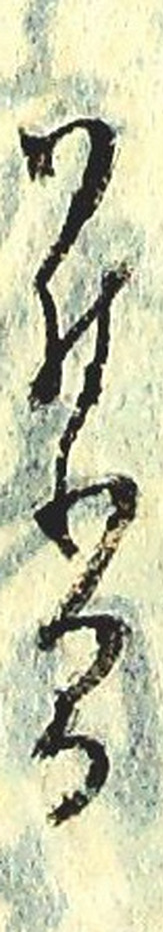同村五人与
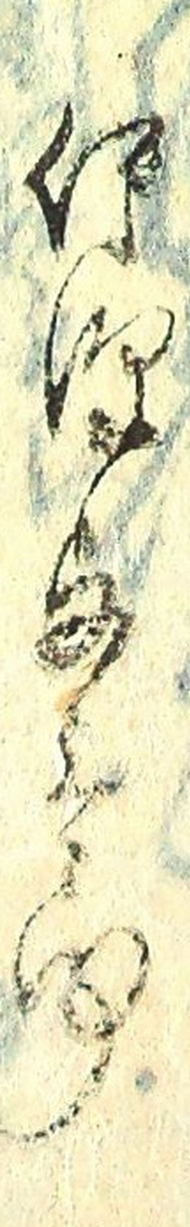伊沢与三郎
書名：諸御願書控(弐番）
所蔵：鳴門教育大学 Naruto University of Education
